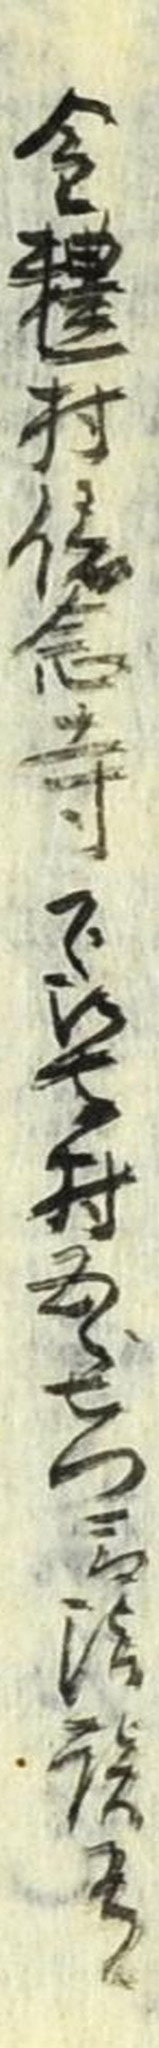金糟村億念寺下江守村五郎右衛門ニ而法談有之
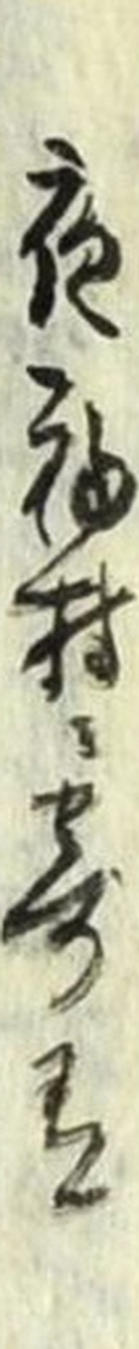夜福村ニ寄有
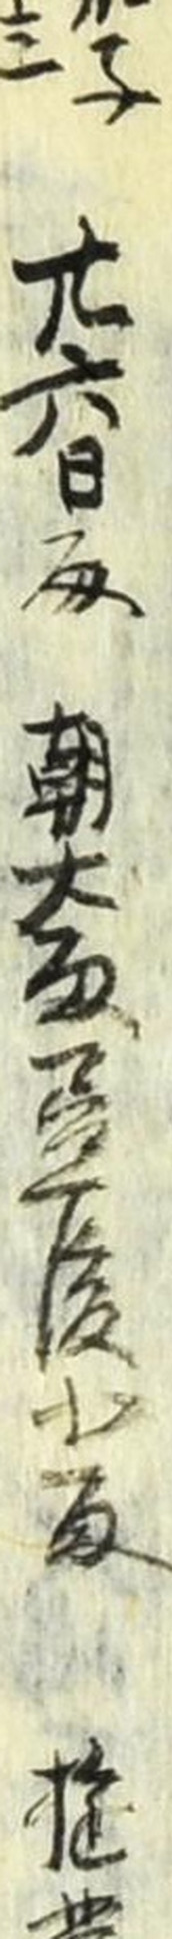廿六日雨朝大雨昼後小雨遊業
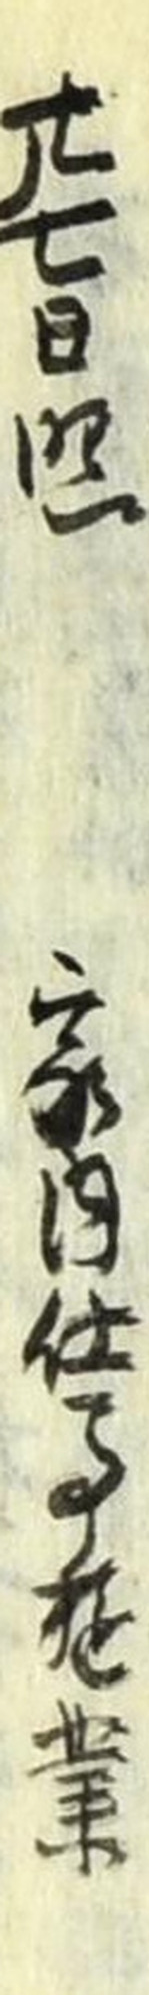廿七日照家内仕事遊業
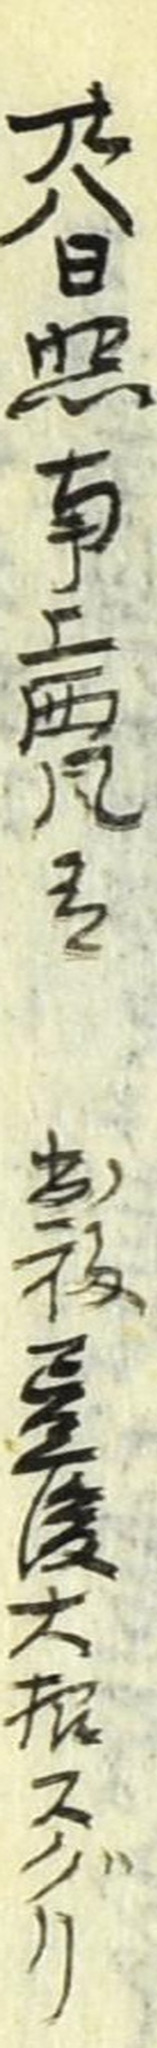廿八日照南上西風有出福昼後大根スグリ

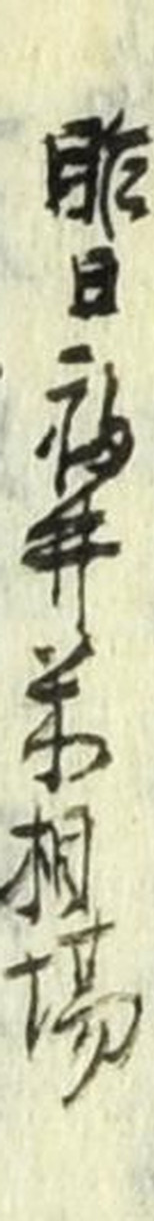昨日福井米相場
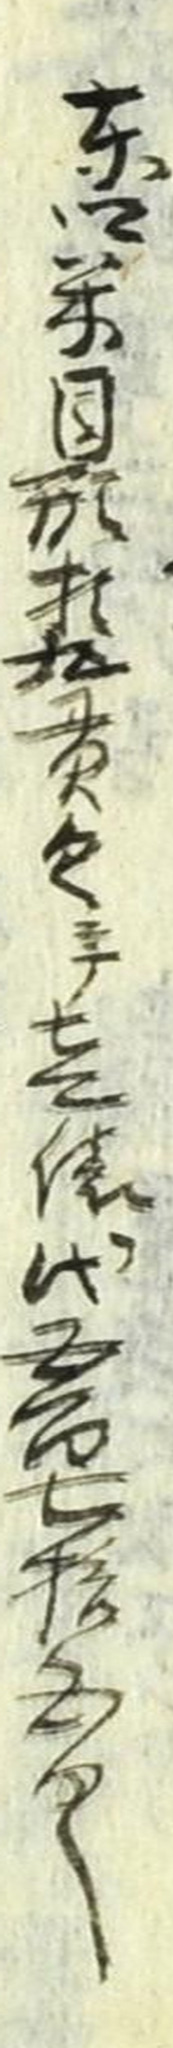東郷米目形拾五貫匁ニテ壱俵代五百七拾五匁
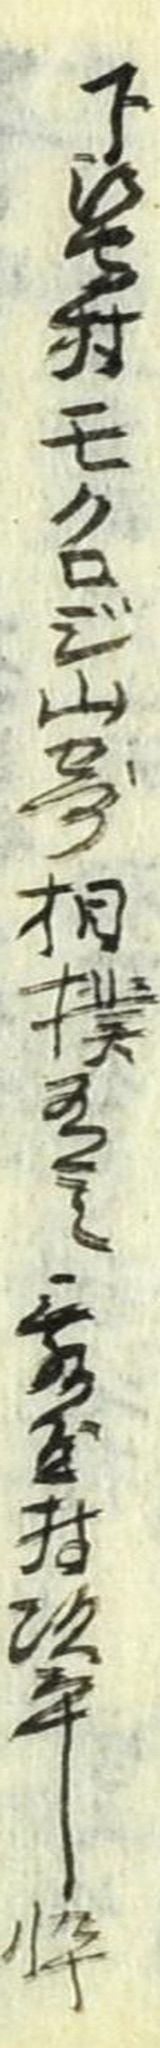下江守村モクロジ山寄相撲有之舞屋村次平倅
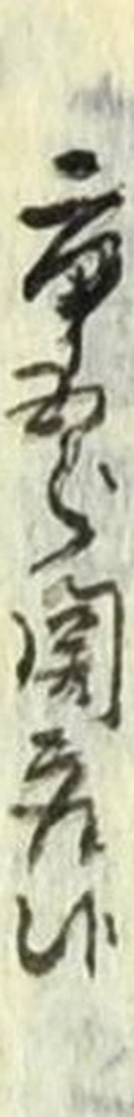市五郎関取候
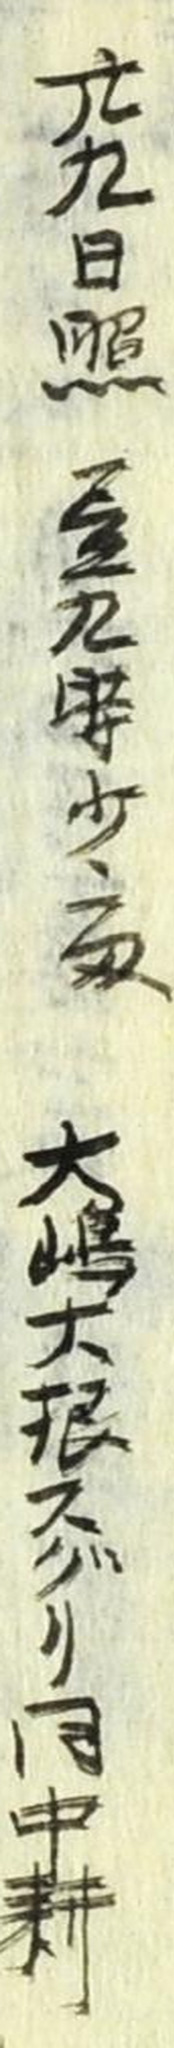廿九日照昼九時少々雨大島大根スグリ同中耕
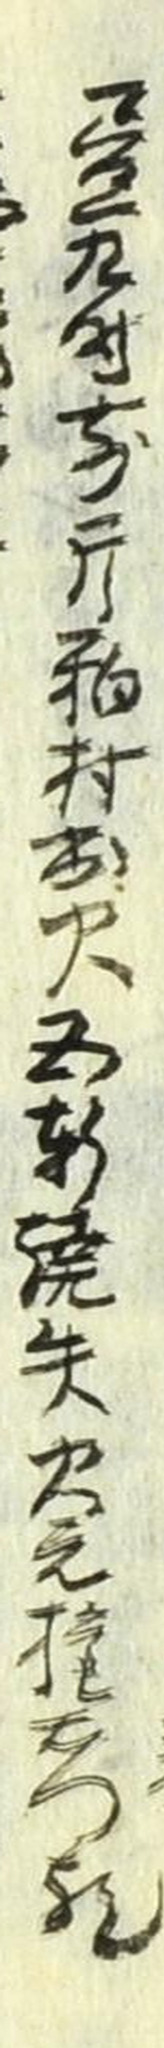昼九時前片粕村出火五軒焼失火元権右衛門歟
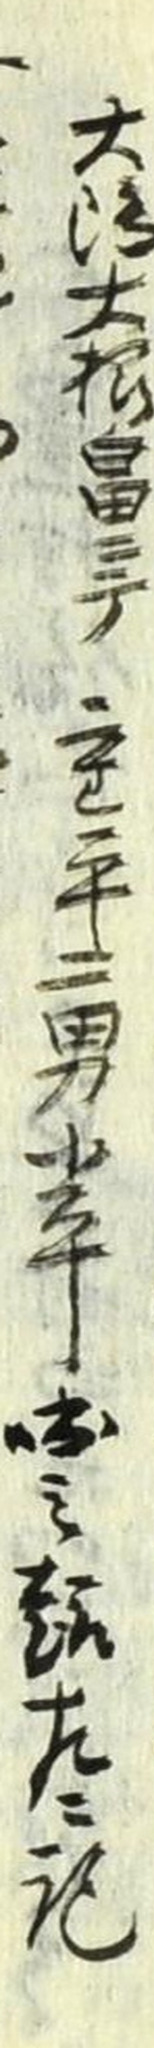大島大根畠ニテ重平二男小平咄之趣左ニ記
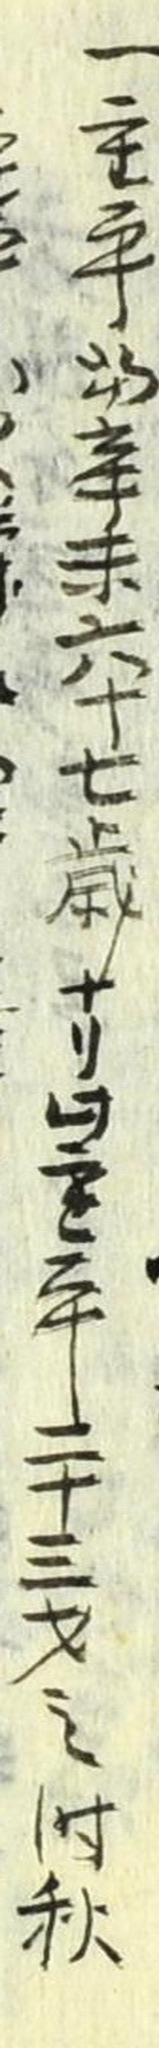一重平当辛未六十七歳ナリ此重平二十三才之時秋
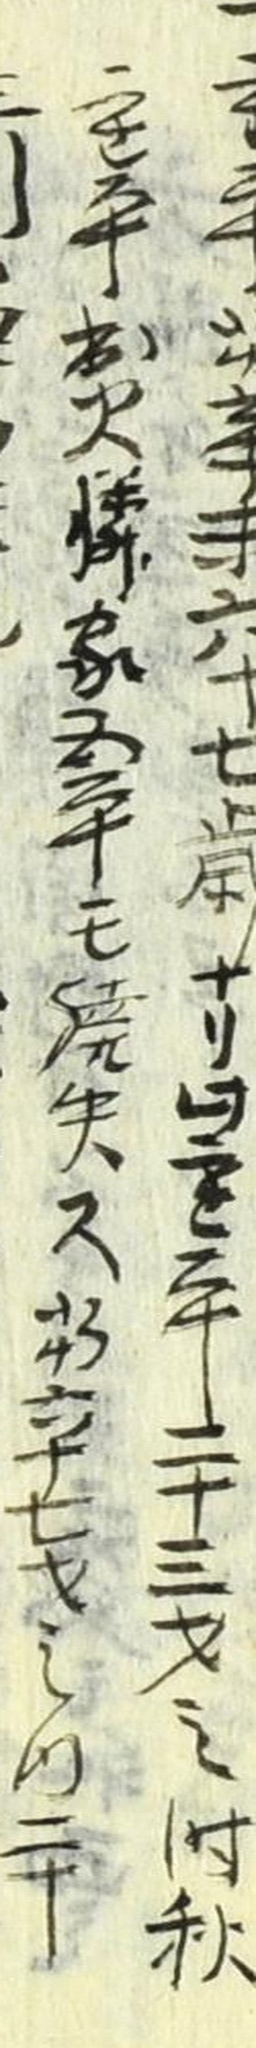重平失火隣家五軒モ焼失ス当六十七才之内二十
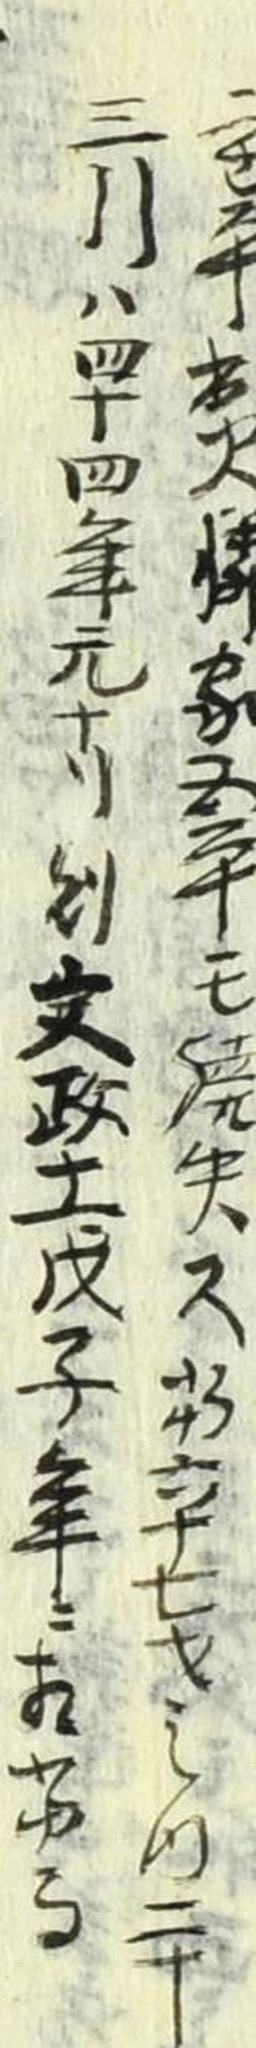三引ハ四十四年元ナリ則文政十一戊子年ニ相当る
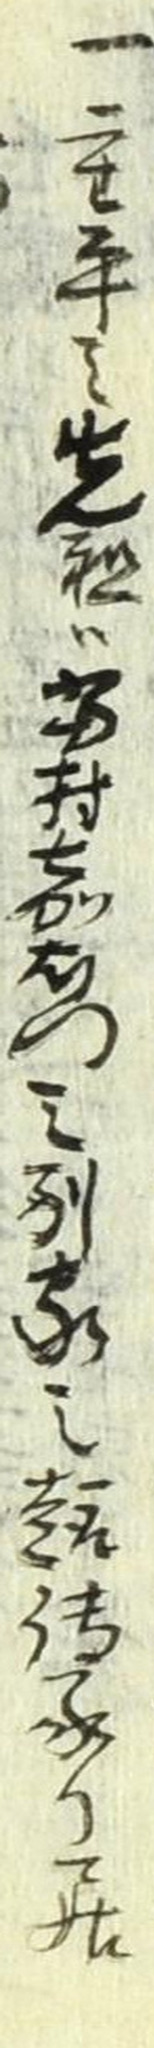一重平之先祖ハ当村嘉左衛門之別家之趣伝承り居
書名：（日記）
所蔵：福井県文書館 Fukui Prefectural Archives
